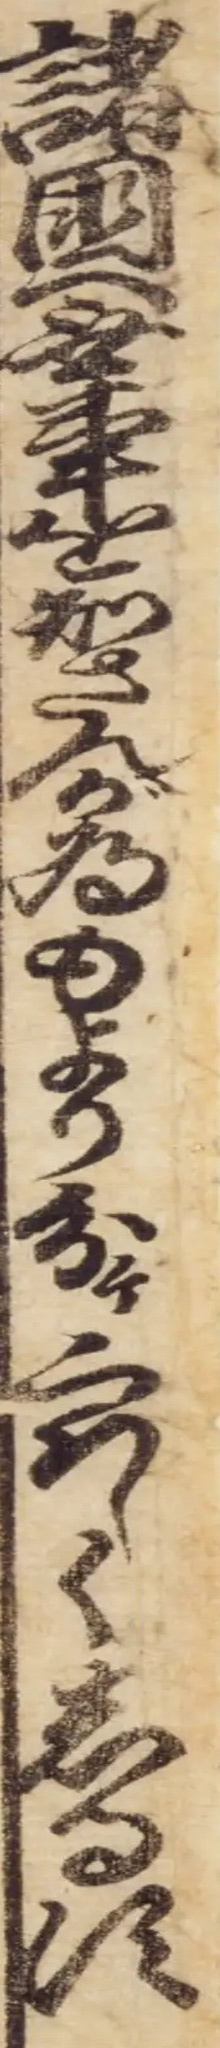諸国へ無事を知さんが為もより分くはしくしるす
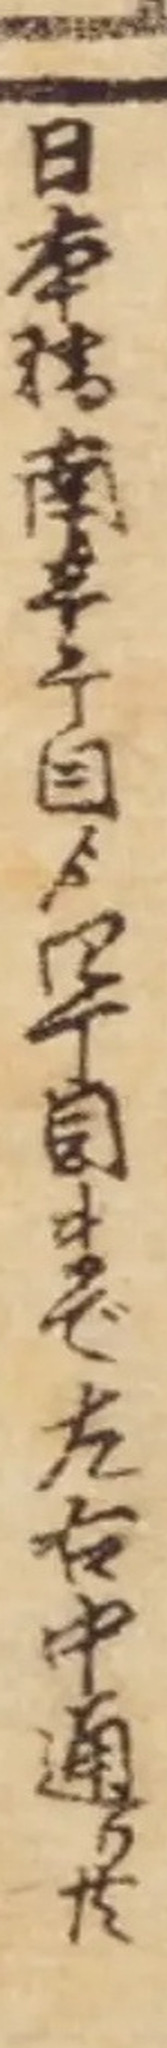日本橋南壱丁目より四丁目まで左右中通り共
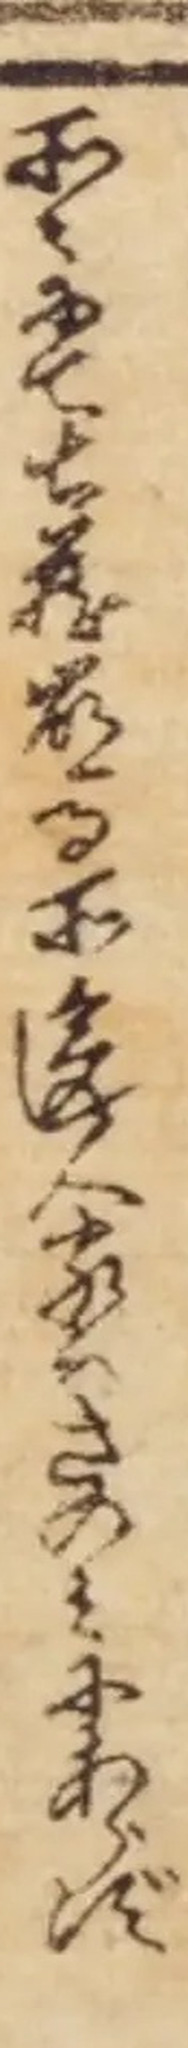所〻にて古蔵崩る所多し人家はさのみにあらず
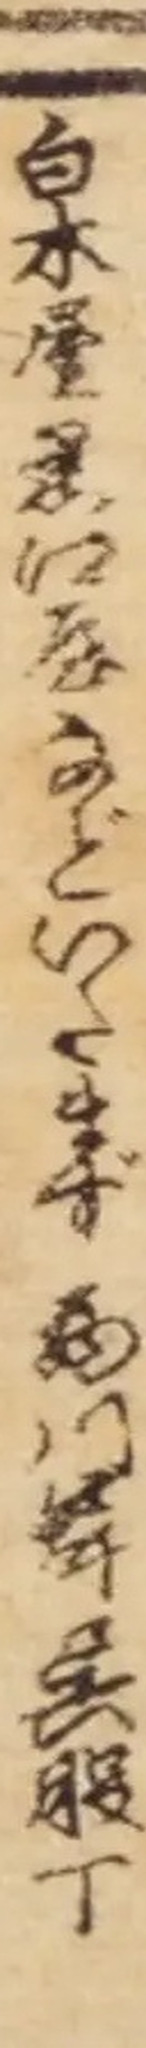白木屋黒江屋などいたまず西川岸呉服丁
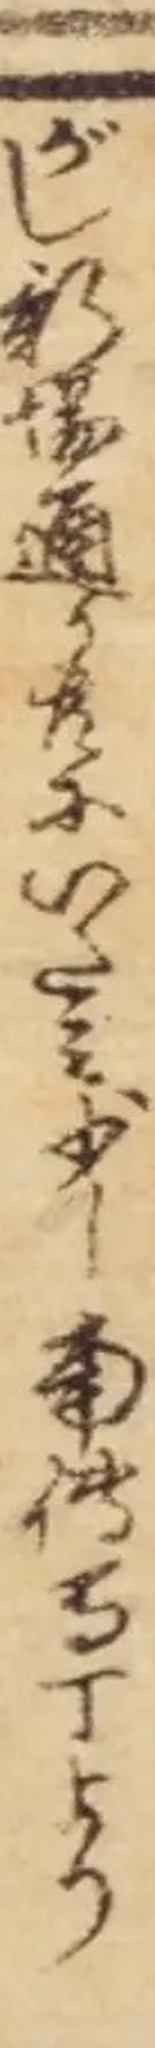がし新場通り共にいたみ少し南伝馬丁より
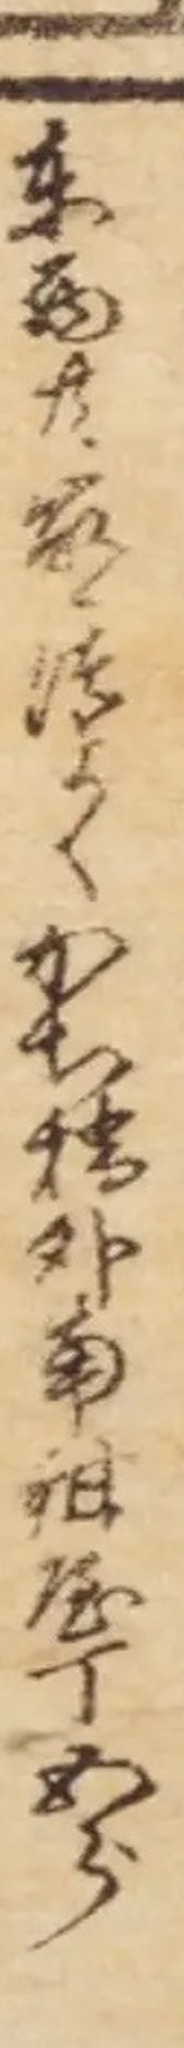東西共崩つよくかち橋外南柑屋丁五郎
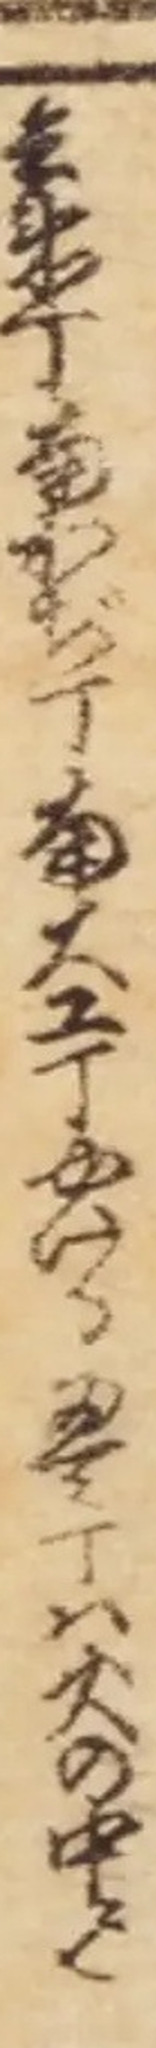兵衞丁南かぢ丁南大工丁やける疊丁は火の中にて
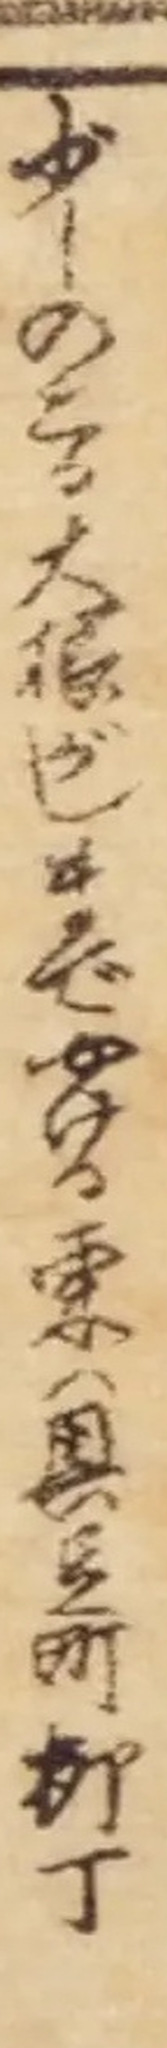少しのこる大根がしまばやける東は具足町柳丁
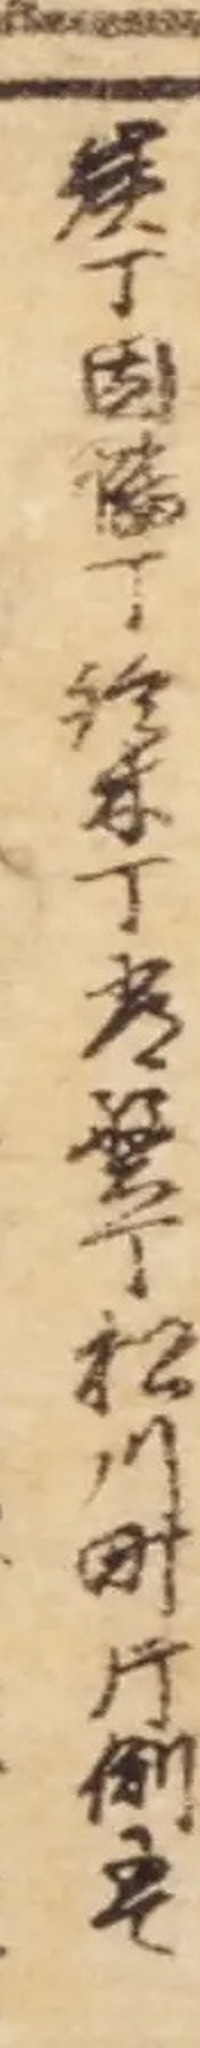炭丁因幡丁鈴木丁常磐丁松川町片側にて
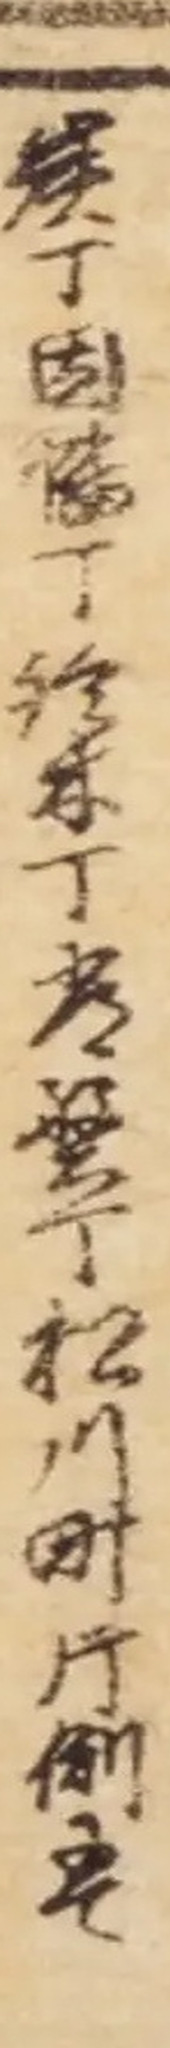炭丁因幡丁鈴木丁常磐丁松川町片側にて
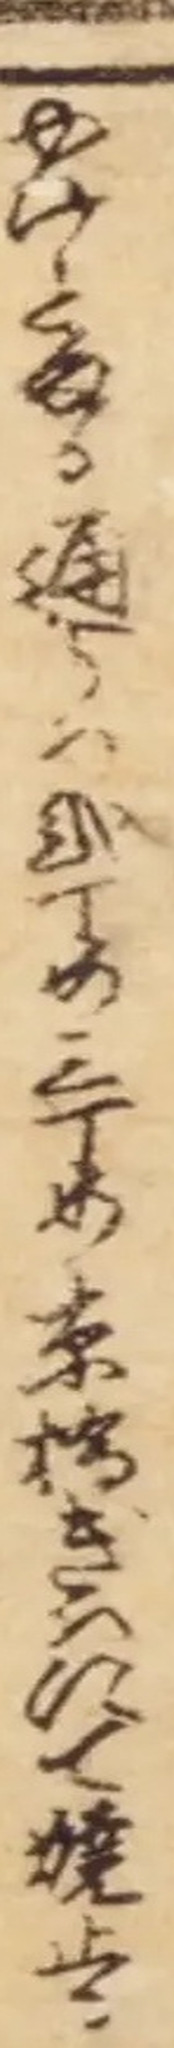やけとまる通りは弐丁め三丁め京橋きはにて焼止る
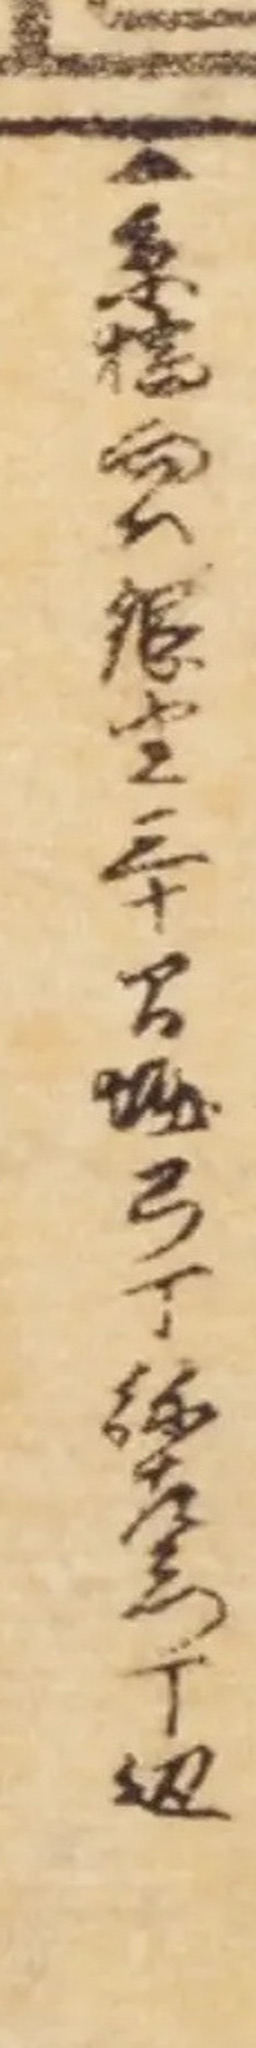▲京橋向は銀座三十間堀弓丁弥左エ門丁辺
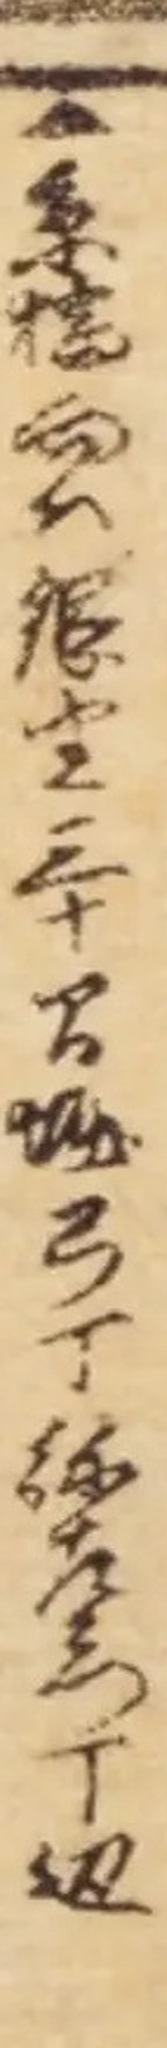▲京橋向は銀座三十間堀弓丁弥左エ門丁辺
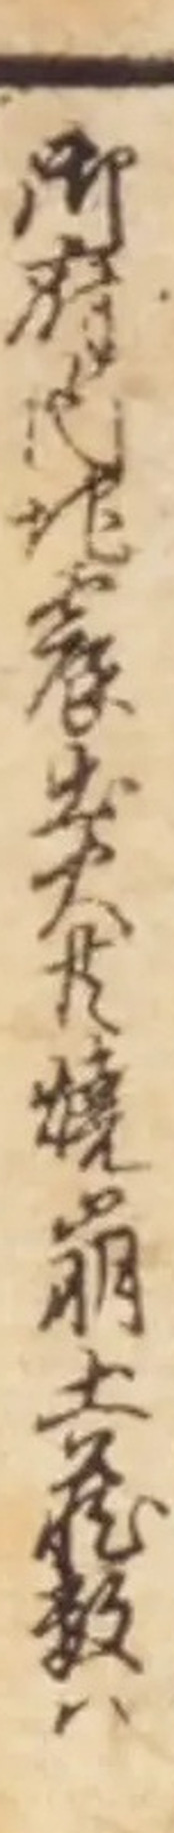御府内地震出火共焼崩土蔵数は
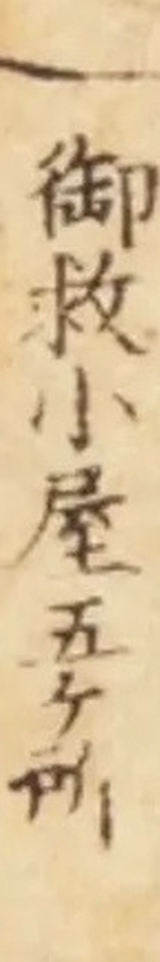御救小屋五ヶ所
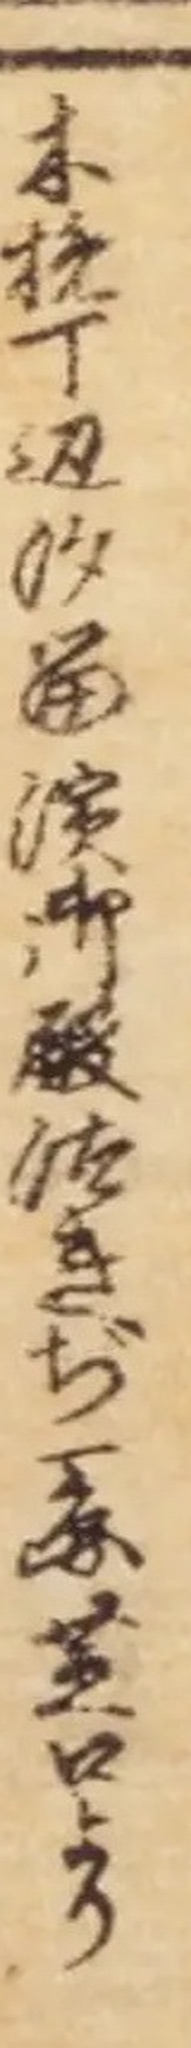木挽丁辺汐留浜御殿つきぢ一円芝口より
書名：御江戸関八州大地震出火巨細記
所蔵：国立国会図書館 National Diet Library, JAPAN
